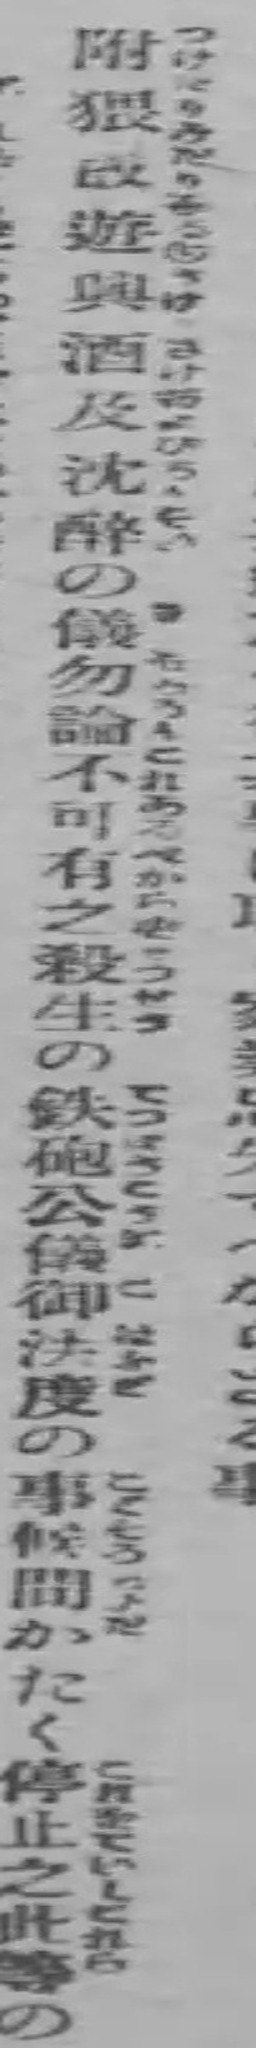附猥成遊興酒及沈酒の儀勿論不可有之殺生の鉄砲公儀御法度の事候間かたく停止之此等の
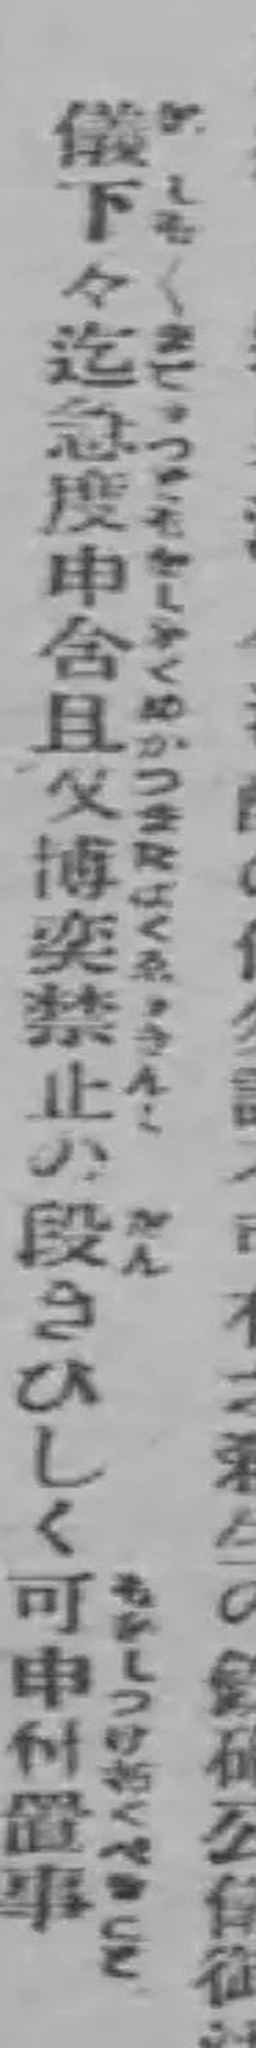儀下々迄急度申含且又博奕禁止の段きひしく可申付置事
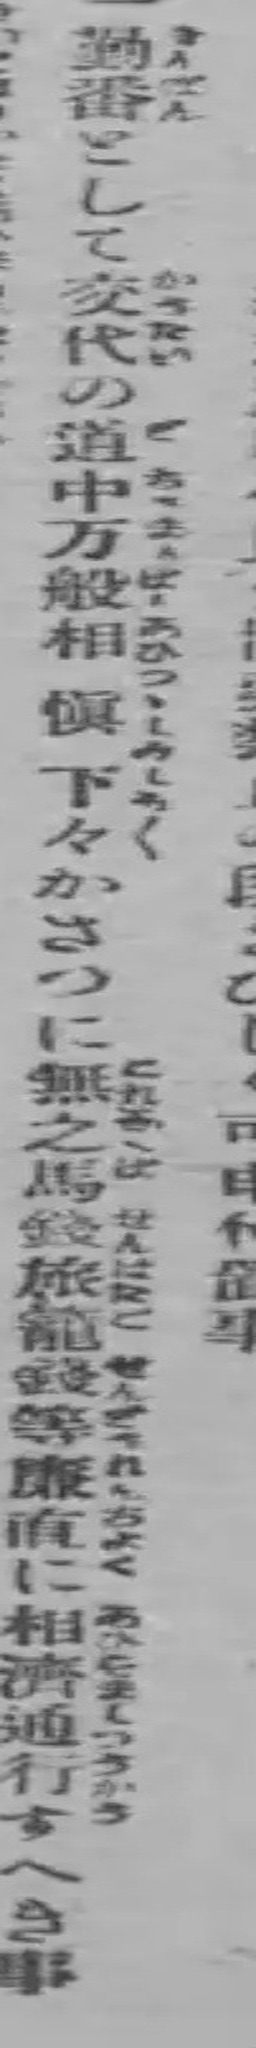一勤番として交代の道中万般相慎下々かさつに無之馬銭旅籠銭等廉直に相済通行すへき事
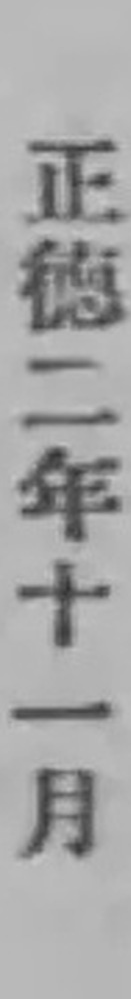正徳二年十一月
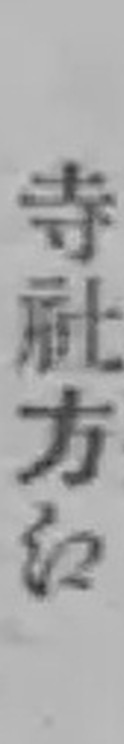寺社方え
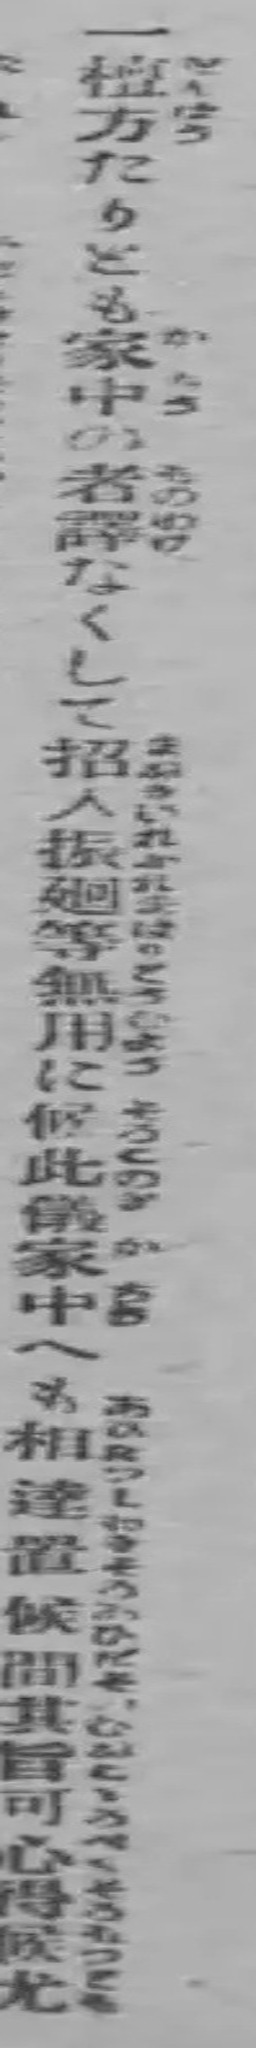一檀方たりとも家中の者訳なくして招入振廻等無用に候此儀家中へも相達置候間其旨可心得候尤
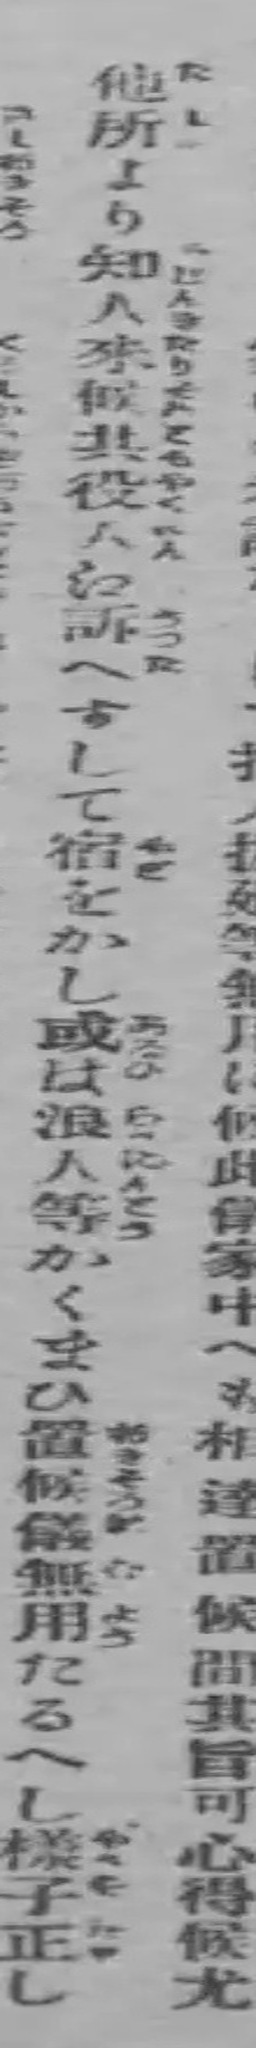他所より知人来候共役人え訴へすして宿をかし或は浪人等かくまひ置候儀無用たるへし様子正し
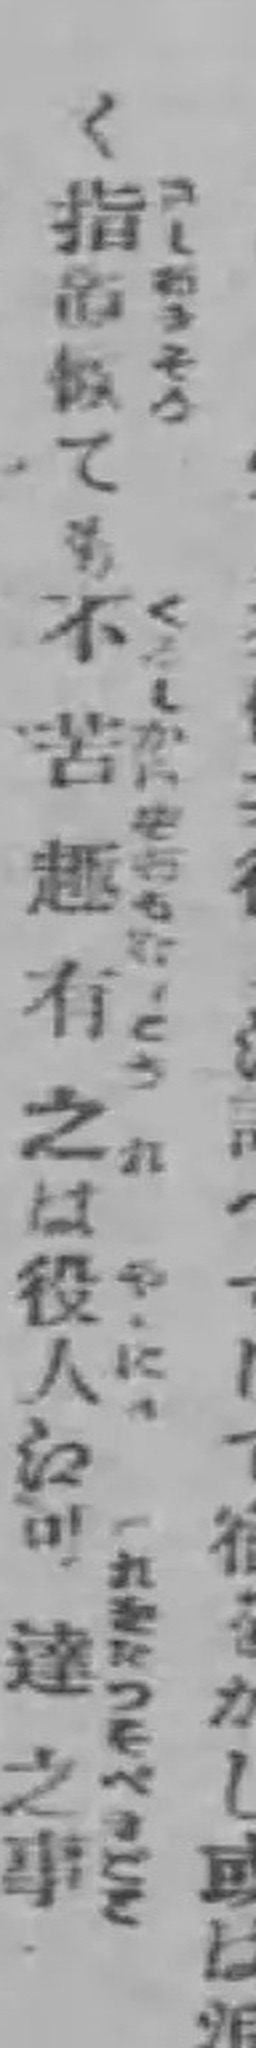く指置候ても不苦趣有之は役人え可達之事
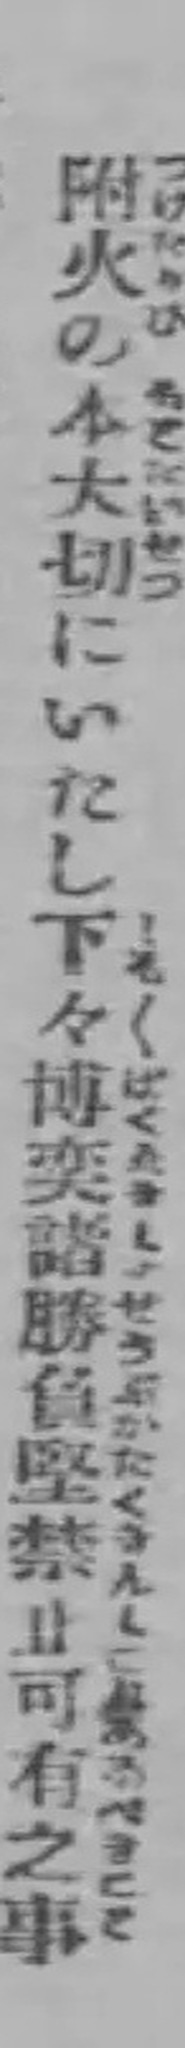附火の本大切にいたし下々博奕諸勝負堅禁止可有之事
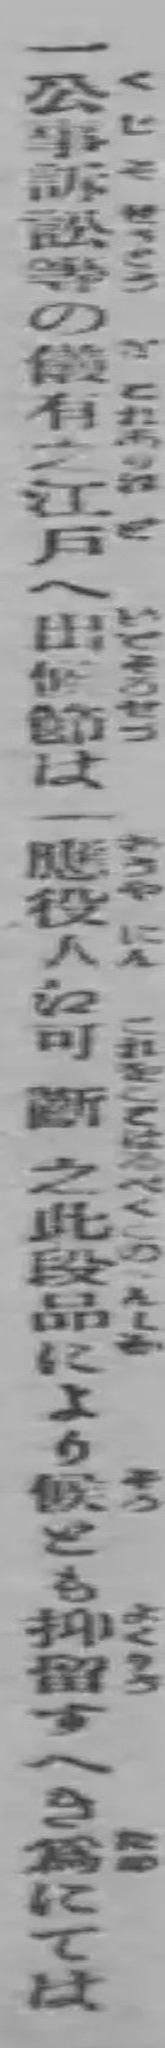一公事訴訟等の儀有之江戸へ出候節は一応役人え可断之此段品により候とも抑留すへき為にては
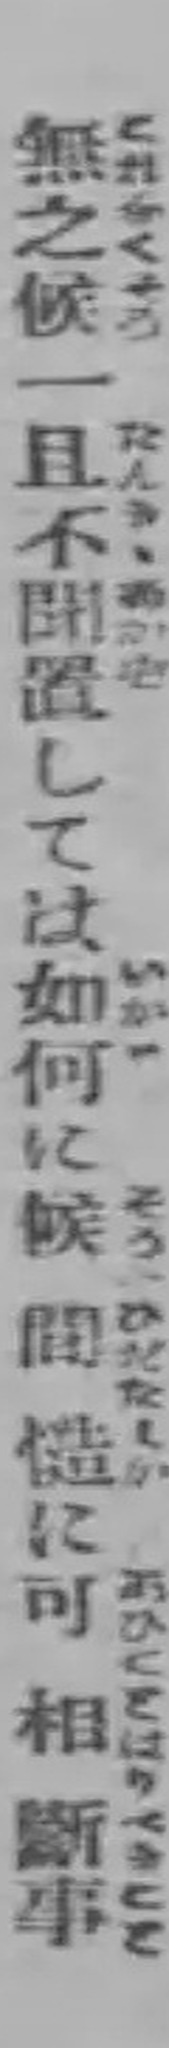無之候一且不聞置しては如何に候間慥に可相断事
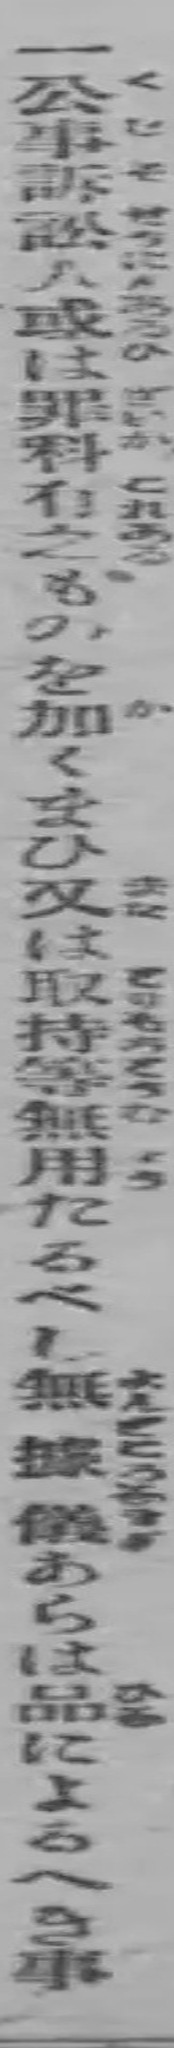一公事訴訟人或は罪科有之ものを加くまひ又は取持等無用たるべし無拠儀あらは品によるへき事
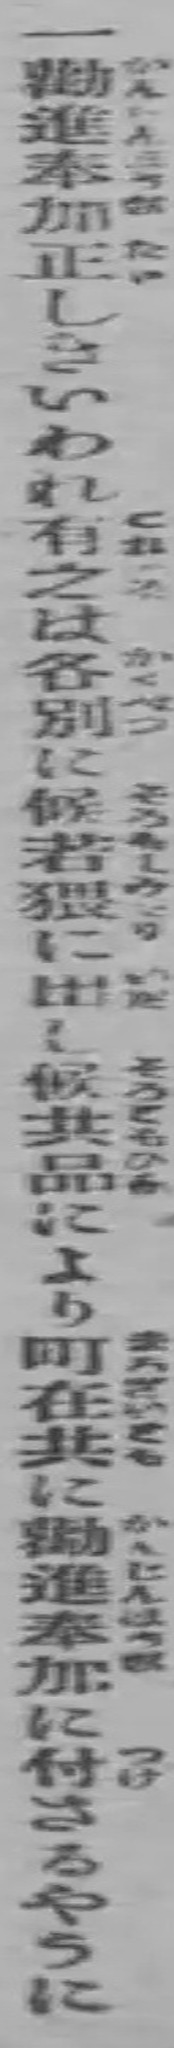一勧進奉加正しきいわれ有之は各別に候若猥に出し候共品により町在共に勧進奉加に付さるやうに
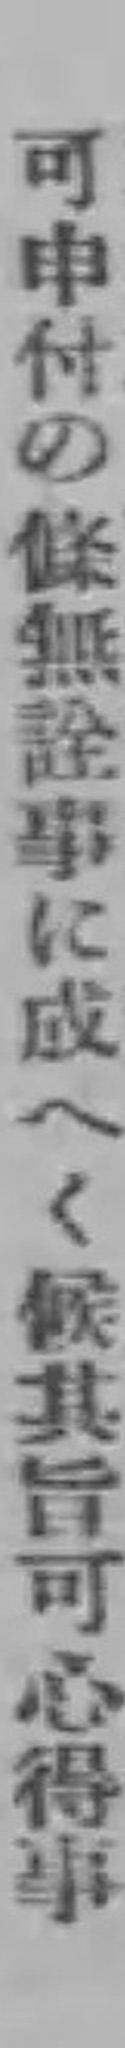可申付の条無詮事に成へく候其旨可心得事
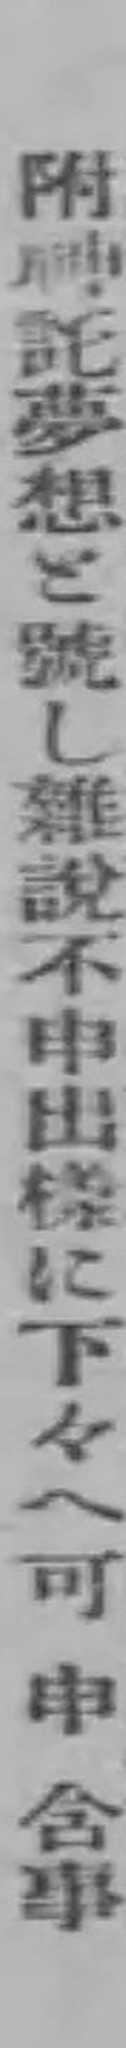附神託夢想と号し雑説不申出様に下々へ可申含事
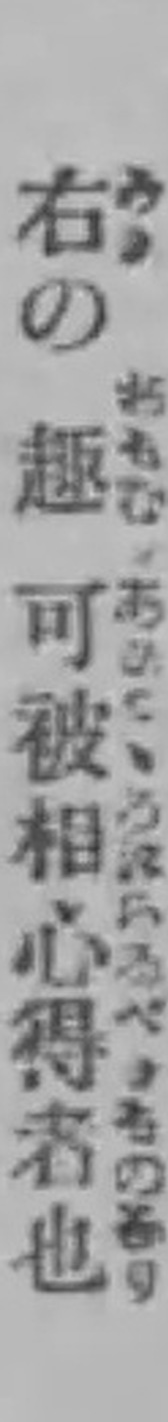右の趣可相心得者也
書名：豊橋市史談
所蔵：国立国会図書館 National Diet Library, JAPAN
